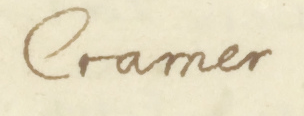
Cramer
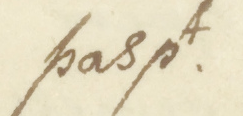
paspt.
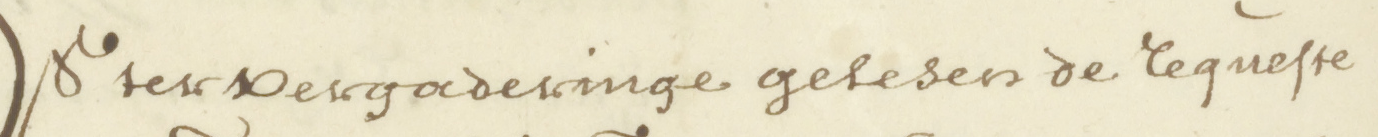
Is ter vergaderinge gelesen de requeste
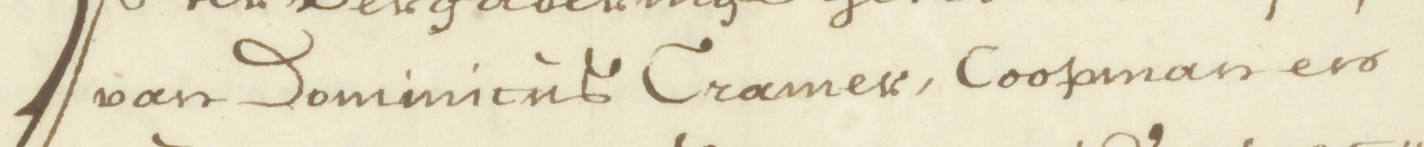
van Dominicus Cramer, Coopman en
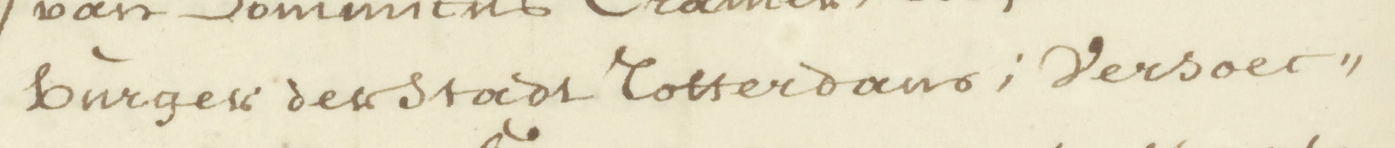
burger der stadt Rotterdam; versoec„
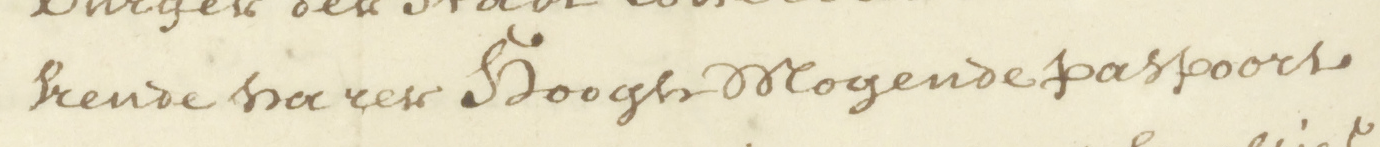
kende harer Hoogh Mogende paspoort
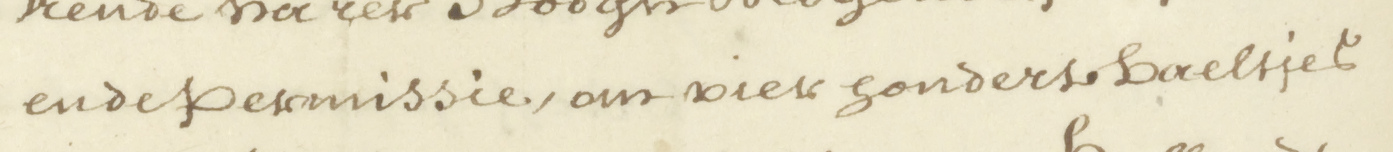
ende permissie om vier hondert baeltjes
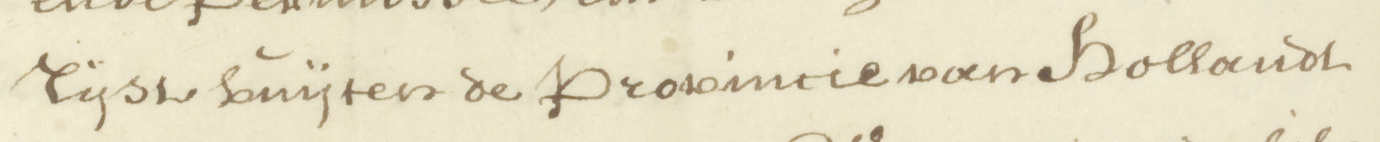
rijst buijten de provincie van Hollandt
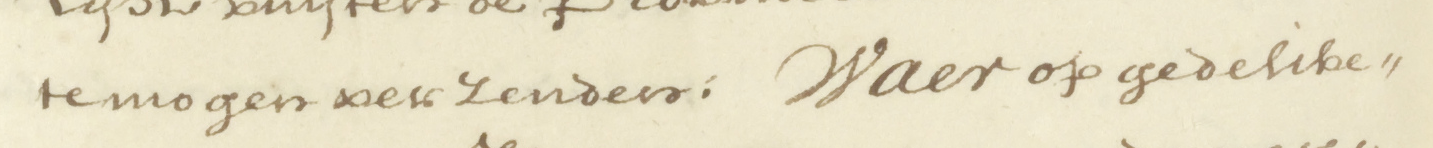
te mogen verzenden: Waer op gedelibe„
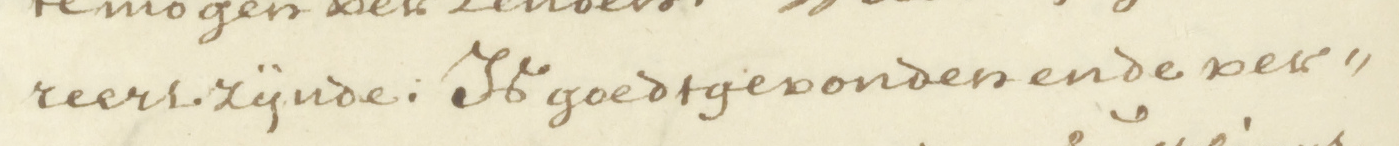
reert zijnde, Is goedtgevonden ende ver„
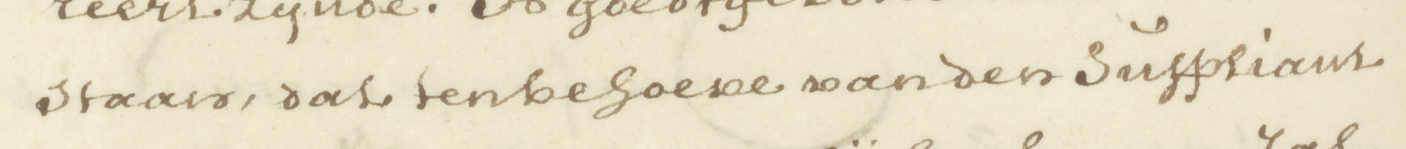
staen, dat tenbehoeve van de suppliant
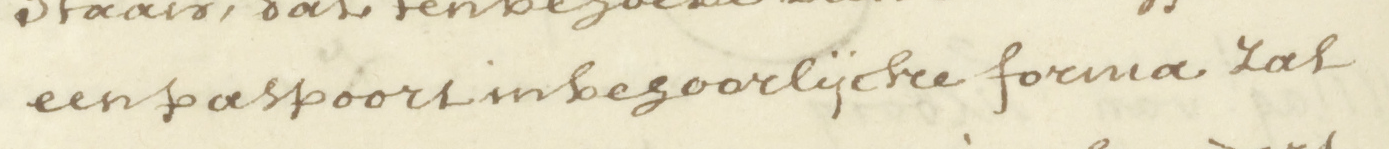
een paspoort in behoorlijcke forma zal
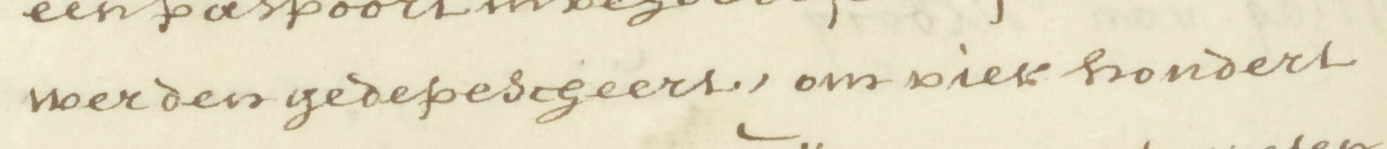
werden gedepescheert, om vier hondert
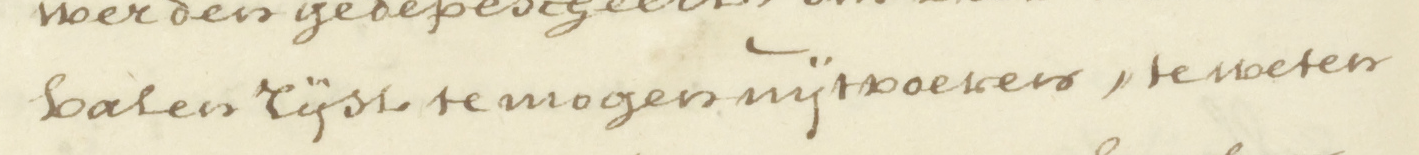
balen rijst te mogen uijtvoeren, te weten
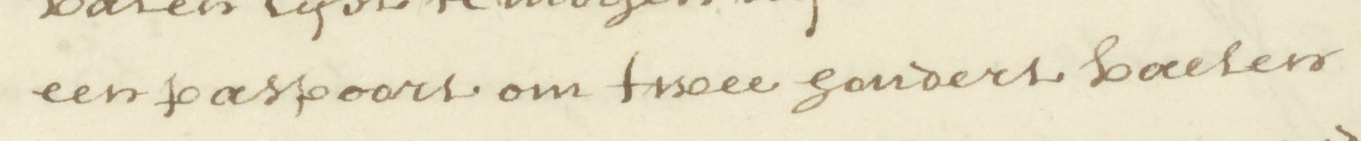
een paspoort om twee hondert baelen
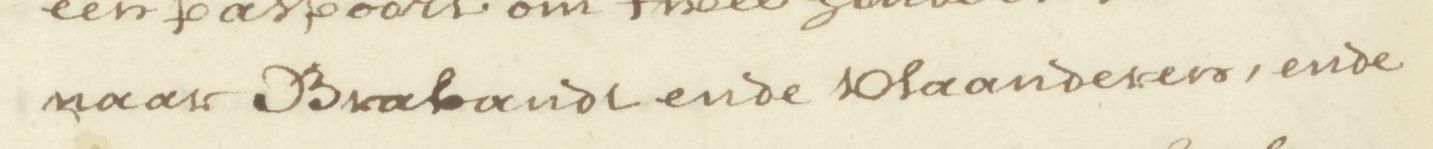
naar Brabandt ende Vlaanderen, ende
